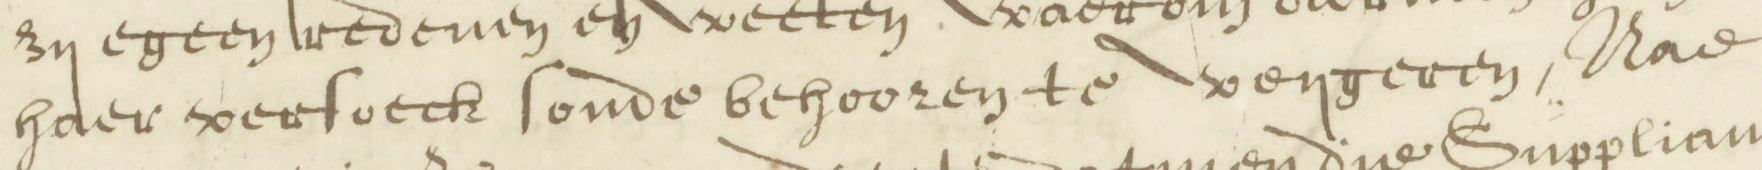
haer versoeck soude behooren te weygeren. Nae
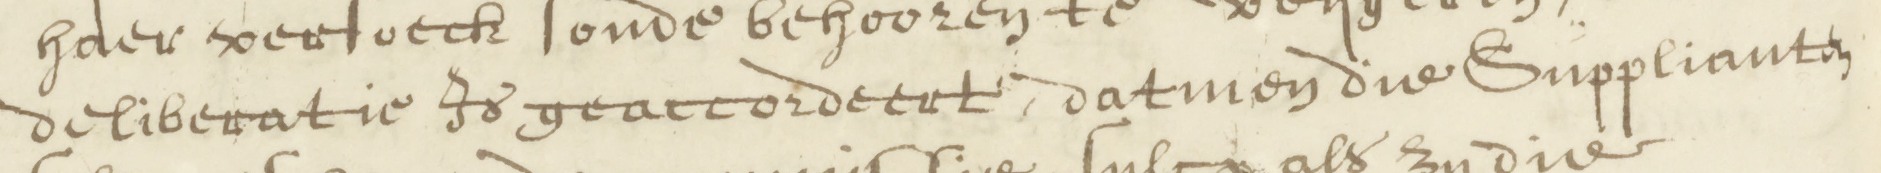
deliberatie Is geaccordeert, datmen die Supplianten
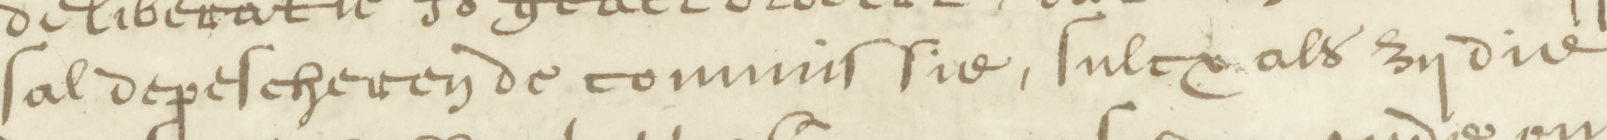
sal depescheren de commissie, sulcx als zy die
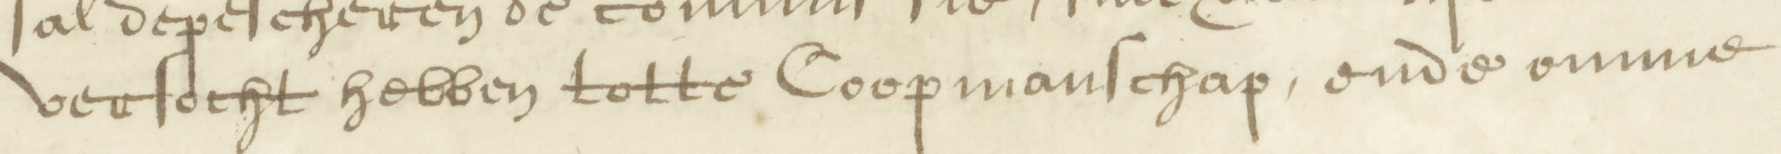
versocht hebben totte Coopmanschap, ende omme
